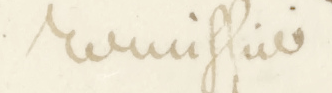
remissie
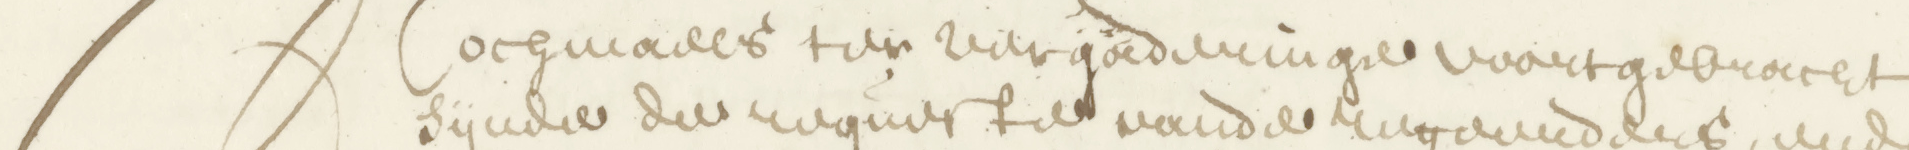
Nochmaels ter vergaderinge voortgebracht
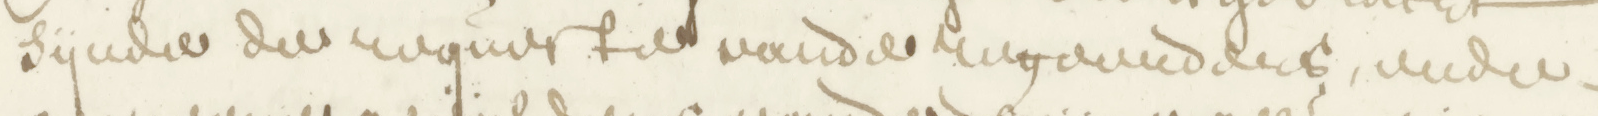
sijnde de requeste vande regeerders, ende
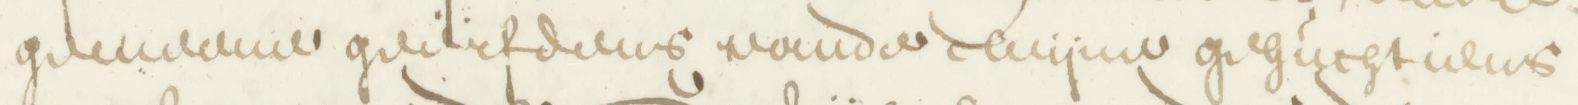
gemeene geerfdens vande cleijne gehuchtiens
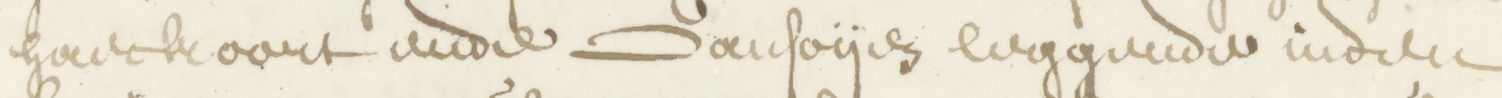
haeckoort ende Gansoijen leggende inden
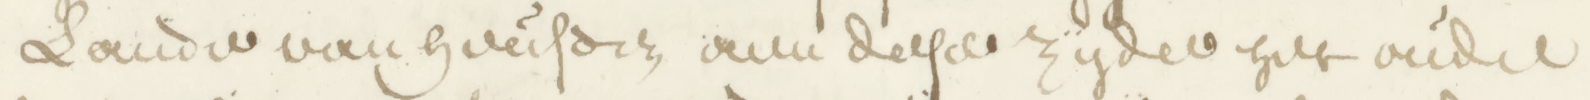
Lande van heusden aen dese zijde het oude
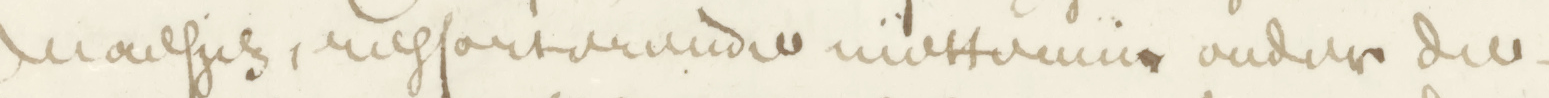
maesjen, ressorterende niettennn onder de
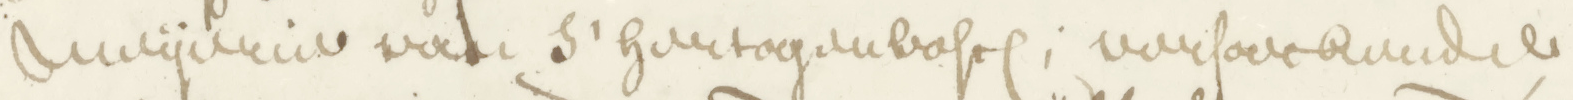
Meijerie van s'hertogenbosch; versoeckende
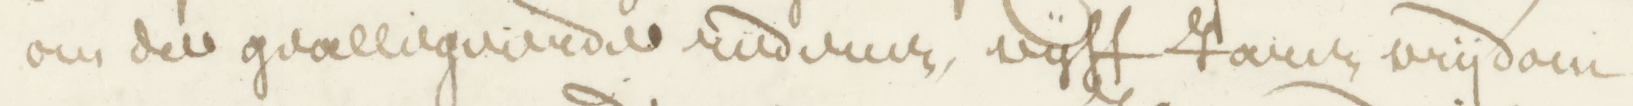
om de geallegeerde redenen, vijff Jaren vrijdom
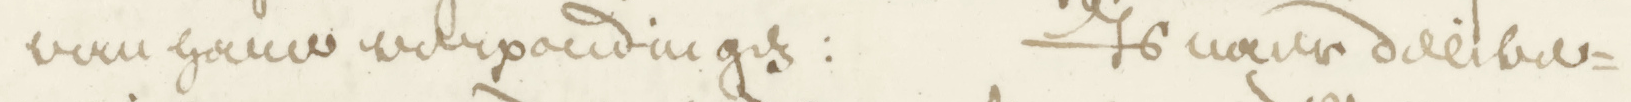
van hare verpondingen: Is naer delibe=
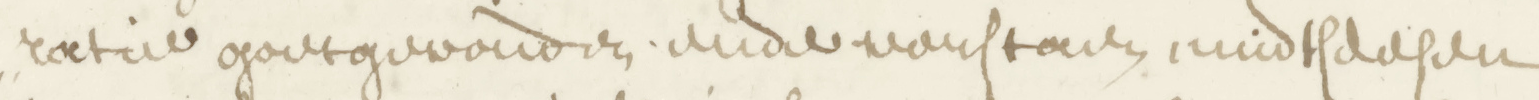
„ratie goetgevonden ende verstaen, midtsdesen
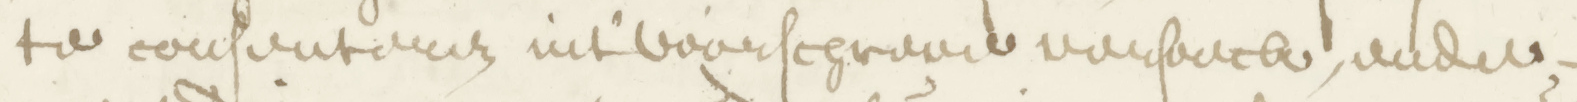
te consenteren int' voorschreve versoeck, ende
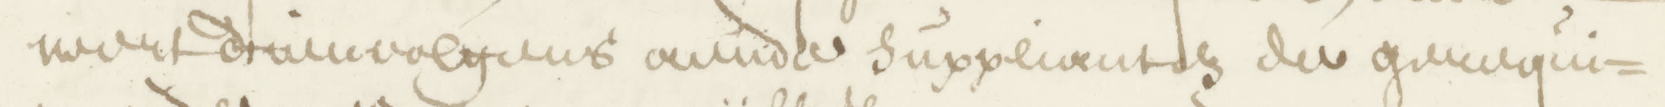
wert dienvolgens aende Supplianten de gerequi=
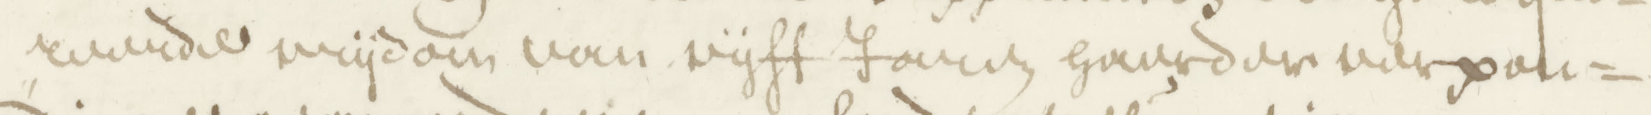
„reerde vrijdom van vijff Jaren haer der verpon=
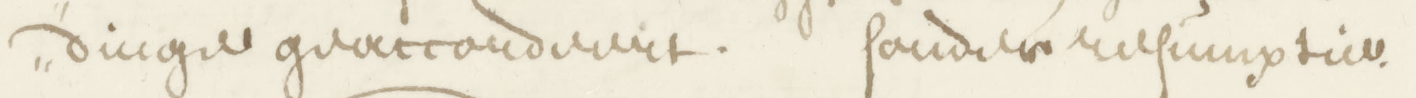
„dinge geaccordeert. sonder resumptie.
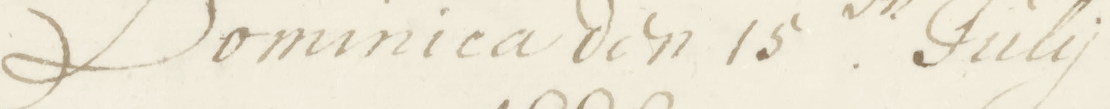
Dominica den 15en. Julij
